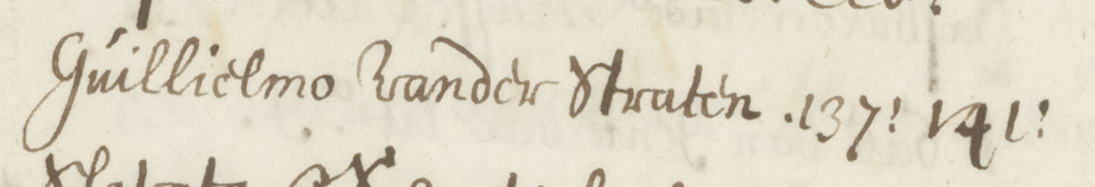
Guillielmo vander Straten. 137: 141:
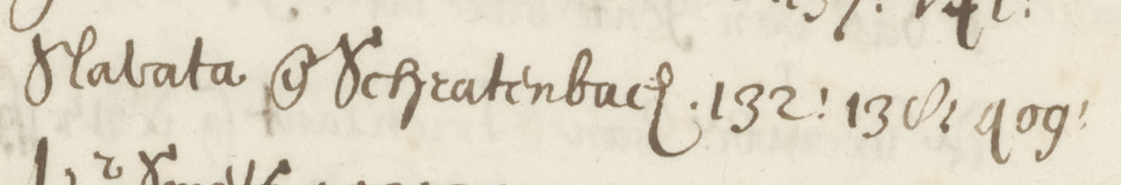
Slavata & Schratenbach. 132: 138: 409:
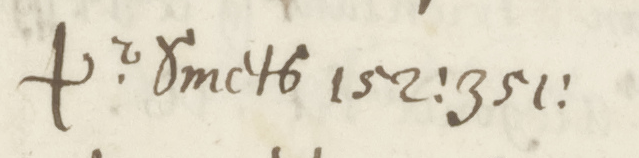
Pr. Smets 152: 351:
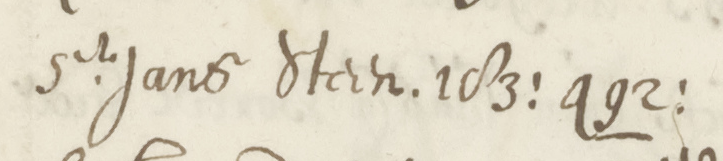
St. Jans Steen. 183: 492:
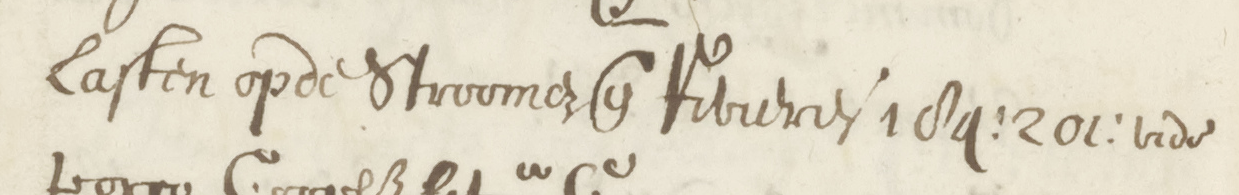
Lasten op de Stroomen & Rivieren 184: 201: vide
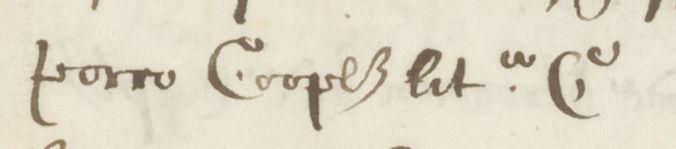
porro Coopl lita. C
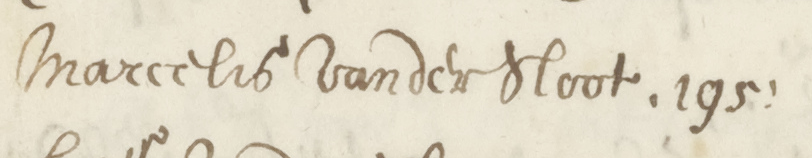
Marcelis van der Sloot, 195:
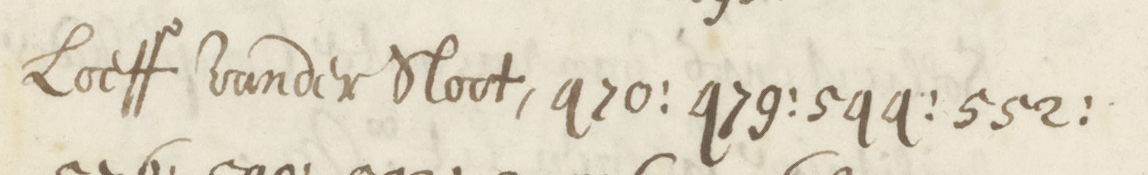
Loeff vander Sloot, 470: 479: 544: 552:
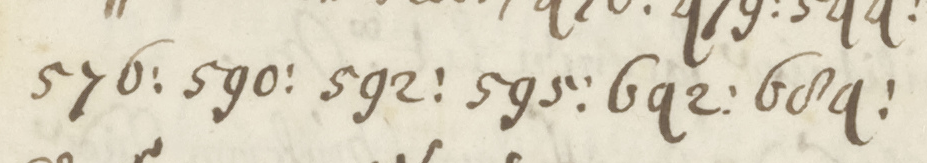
576: 590: 592: 595: 642: 684:
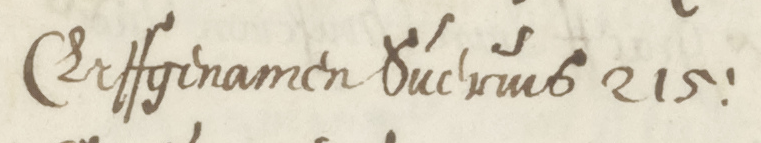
Erffgenamen Suerius 215:
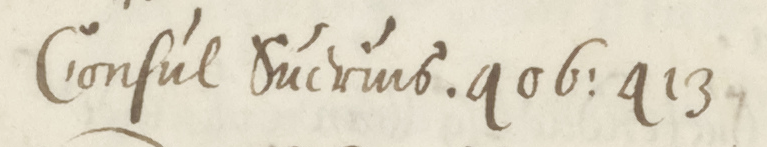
Consul Suerius. 406: 413
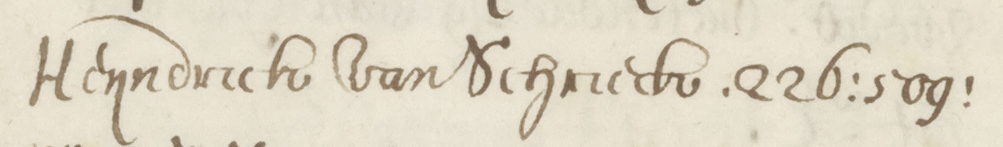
Heyndrick van Schrieck. 226: 509:
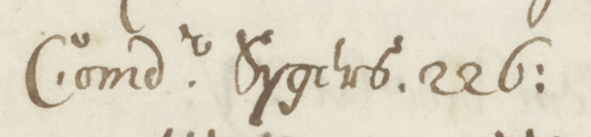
Comdr. Sygers. 226:
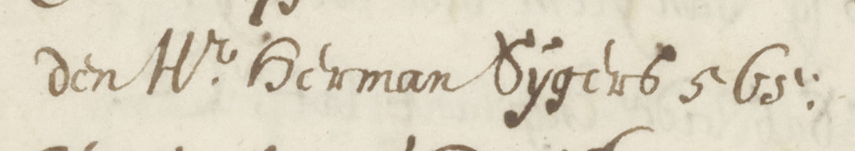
den Hr. Herman Sijgers 565:
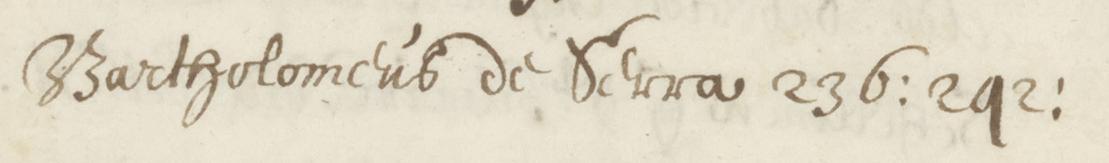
Bartholomeus de Serra 236: 292:
